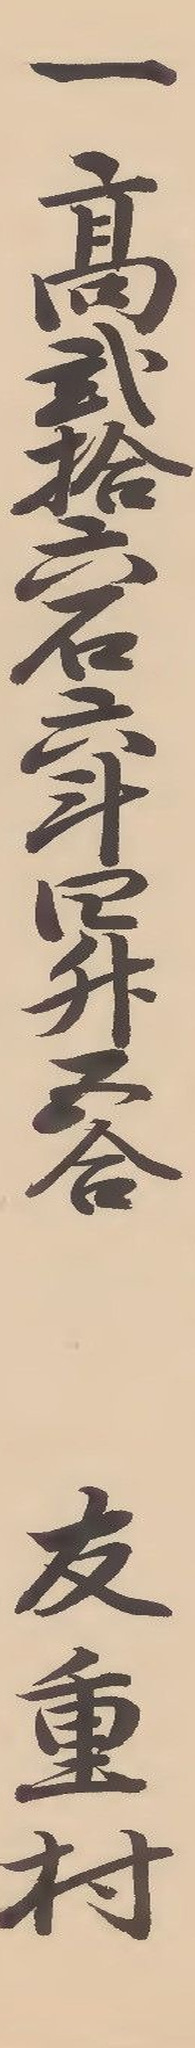一高弐拾六石六斗四升五合友重村
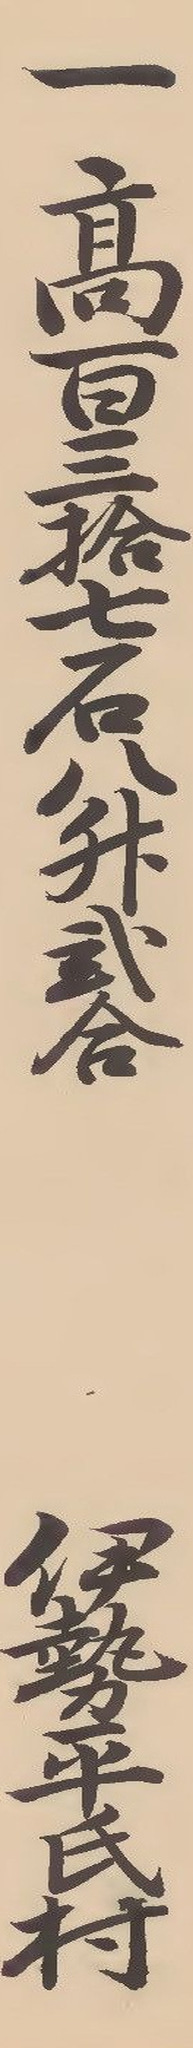一高百三拾七石八升弐合伊勢平氏村
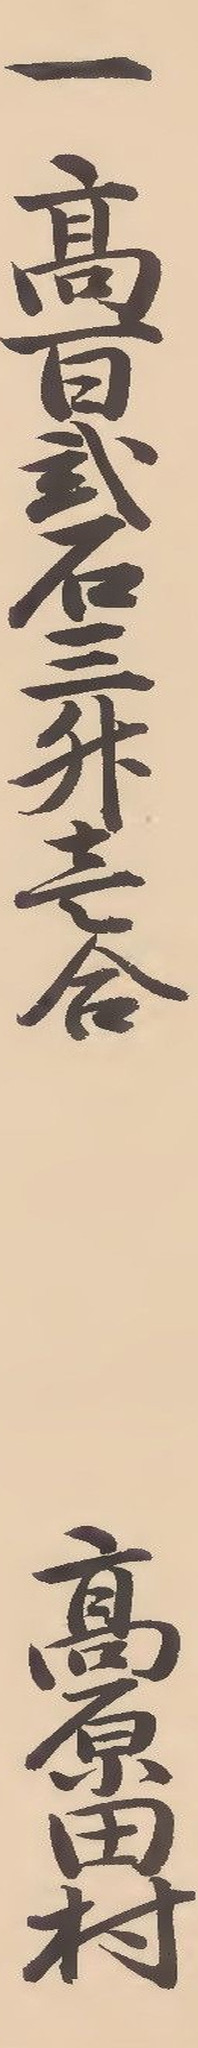一高百弐石三升壱合高原田村
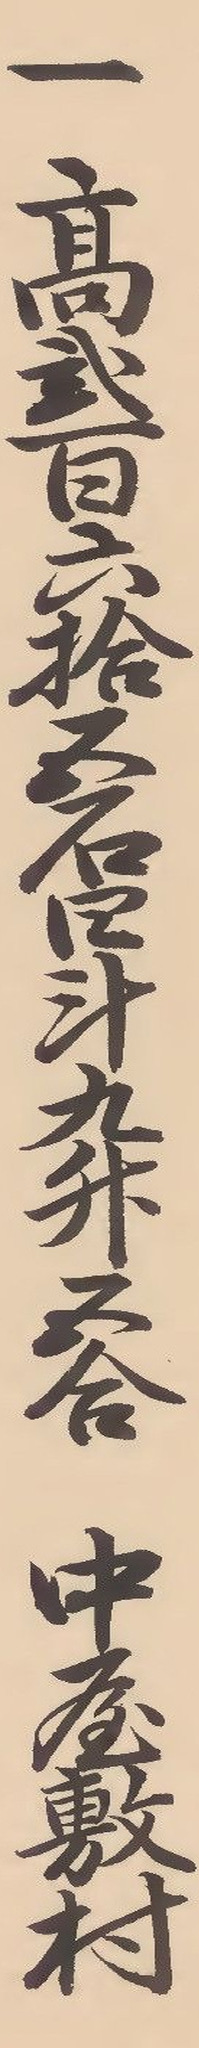一高弐百六拾五石四斗九升五合中屋敷村
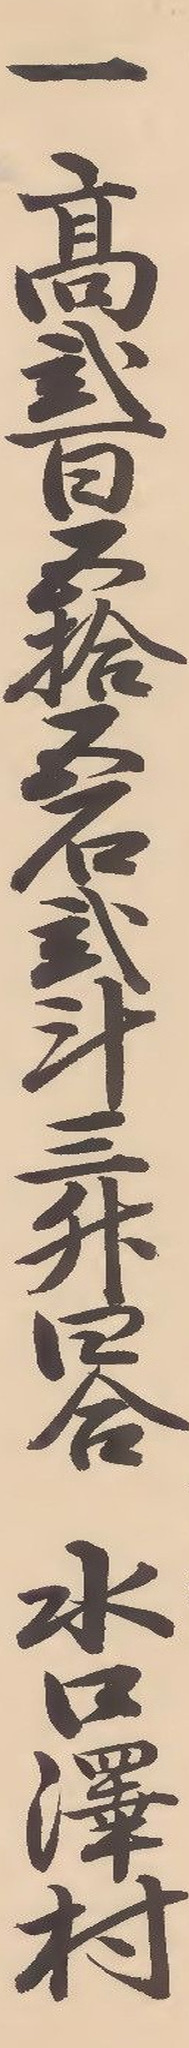一高弐百五拾五石弐斗三升四合水口沢村
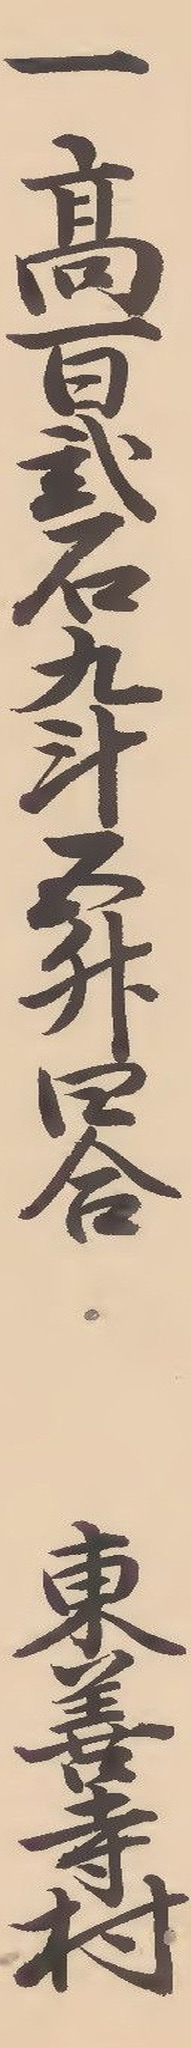一高百弐石九斗五升四合東善寺村

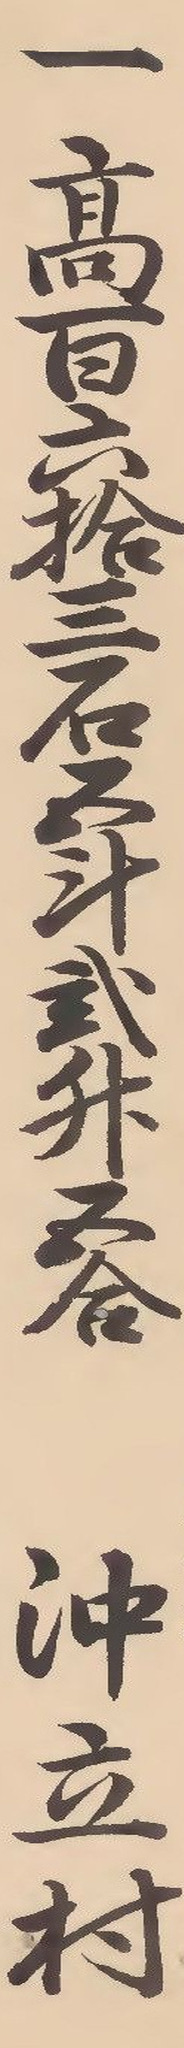一高百六拾三石五斗弐升五合沖立村
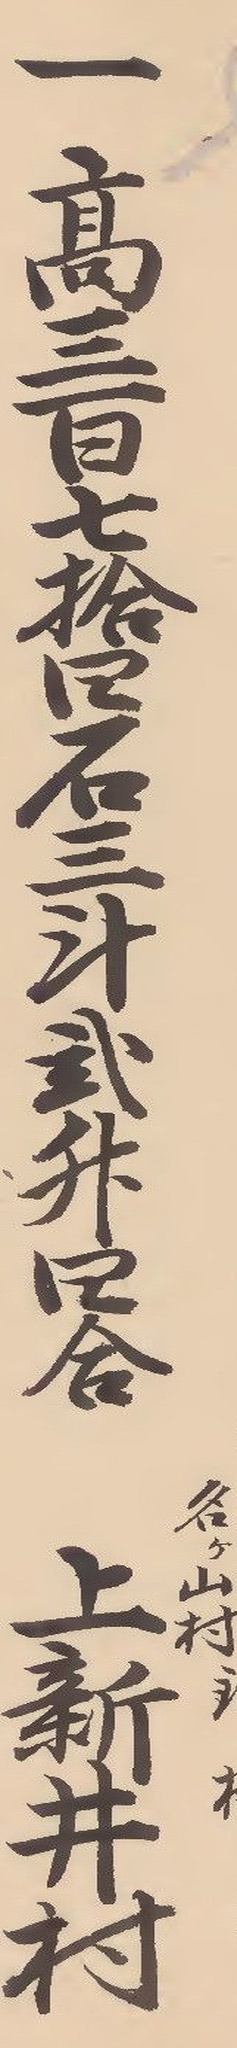一高三百七拾四石三斗弐升四合上新井村
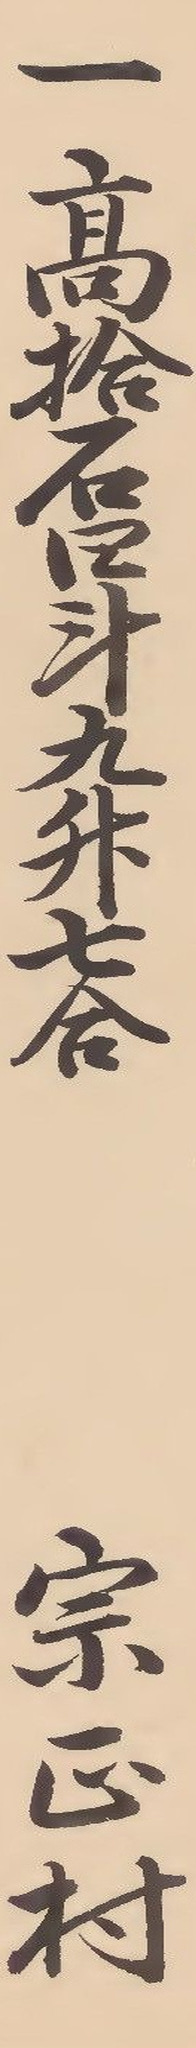一高拾石四斗九升七合宗正村
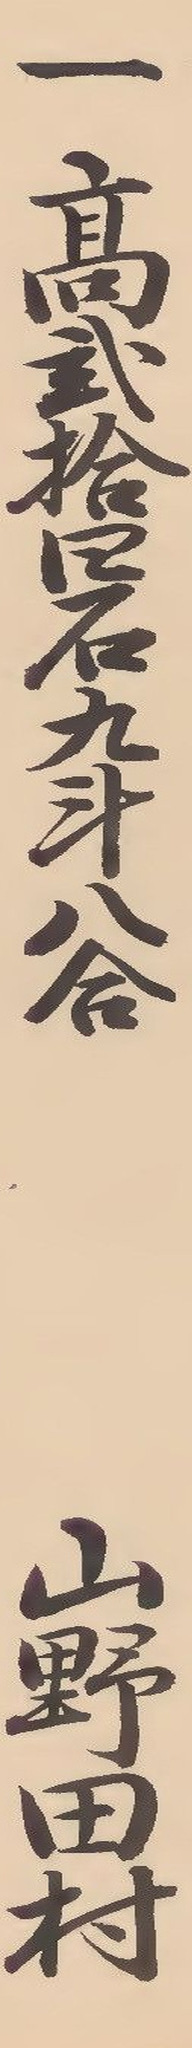一高弐拾四石九斗八合山野田村
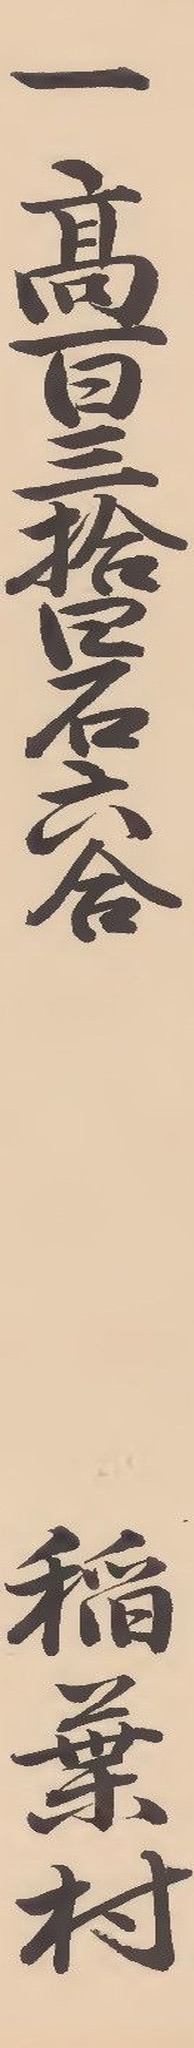一高百三拾四石六合稲葉村
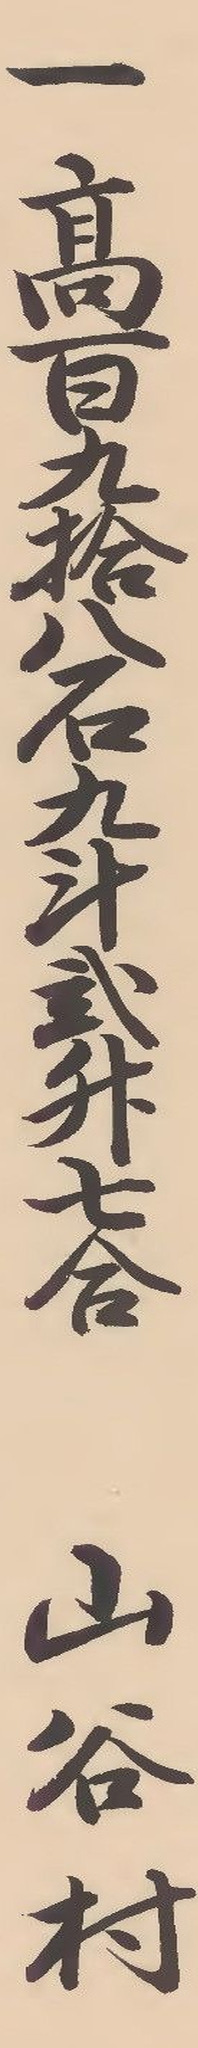一高百九拾八石九斗弐升七合山谷村
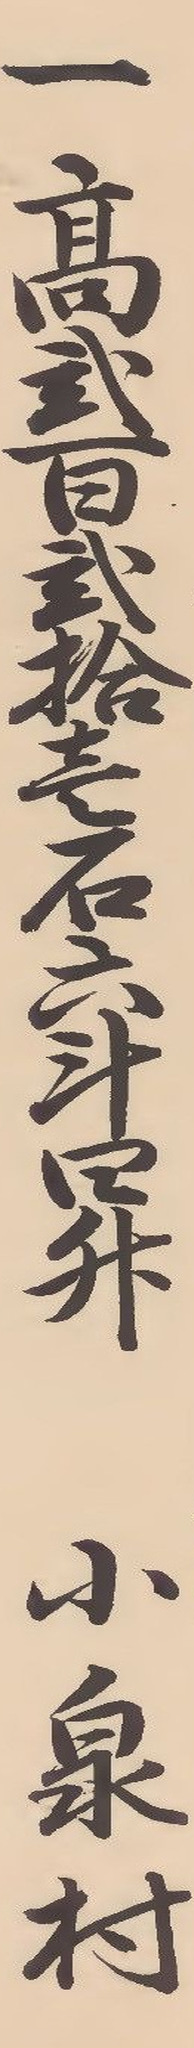一高弐百弐拾壱石六斗四升小泉村
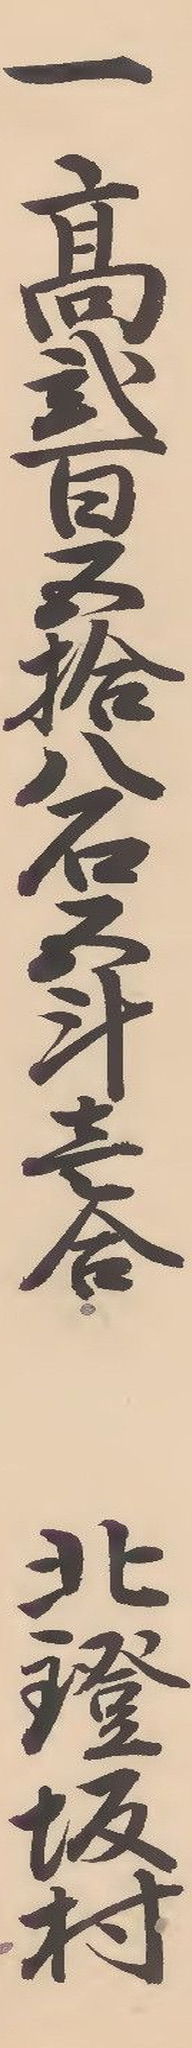一高弐百五拾八石五斗壱合北鐙坂村

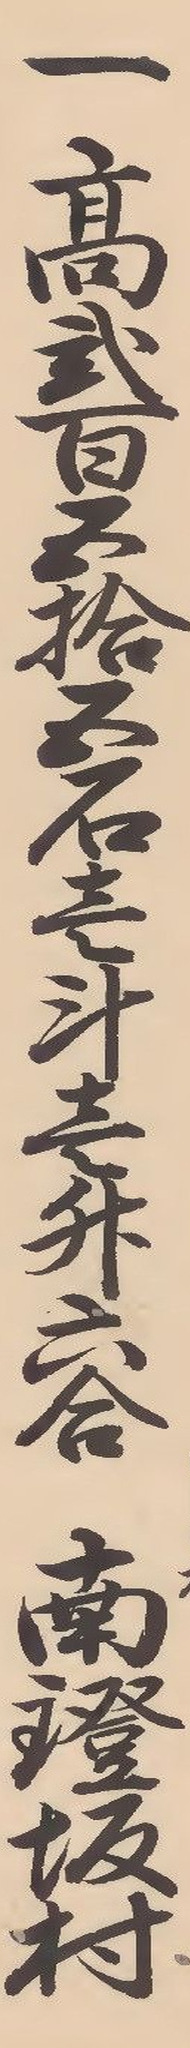一高弐百五拾五石壱斗壱升六合南鐙坂村
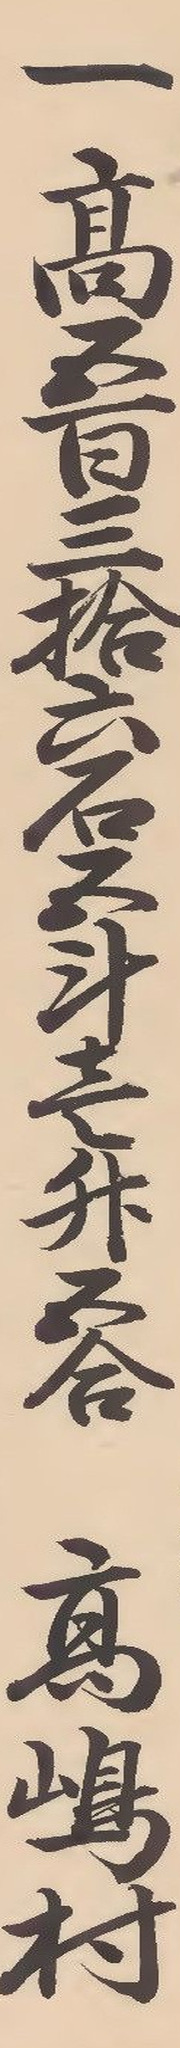一高五百三拾六石五斗壱升五合高島村
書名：越後国郷帳　中
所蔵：国立公文書館 National Archives of Japan
